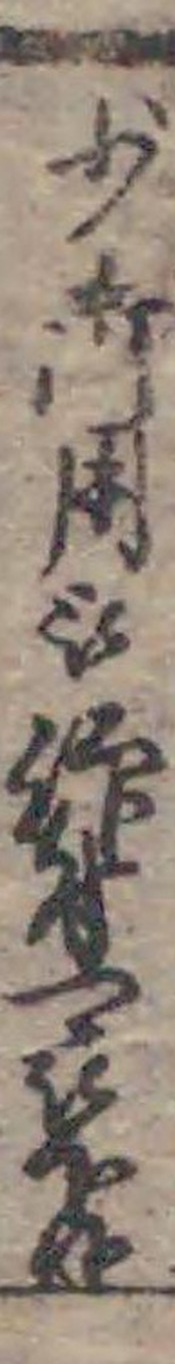少御用被仰付可被下候
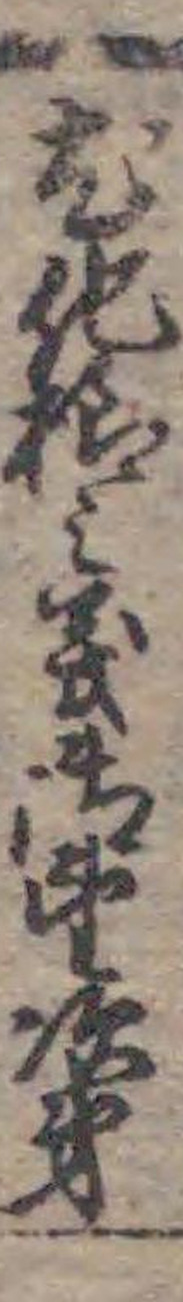尤化様之義御望次第
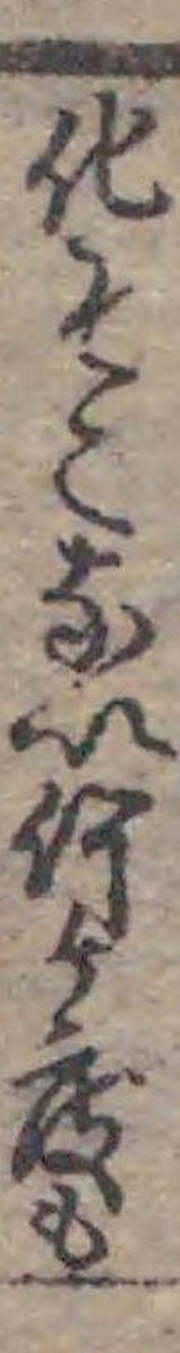化そこない何ケ度も
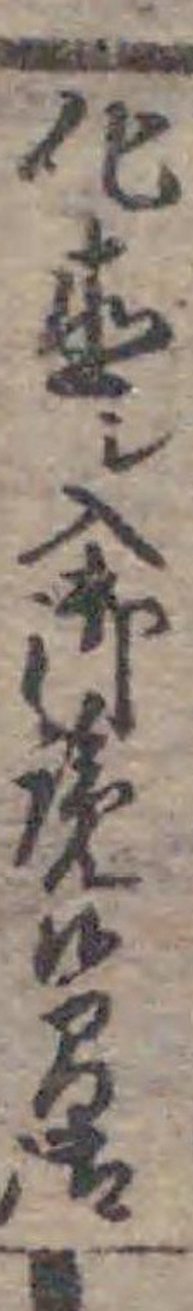化直入御覧候間御
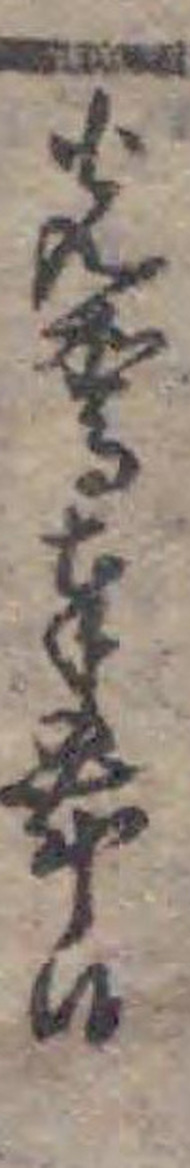光駕奉希候
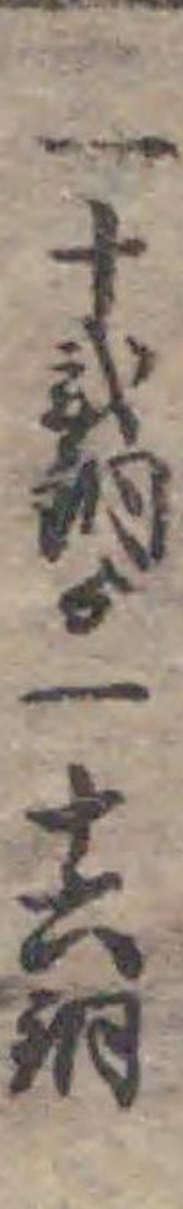一十弐銅ゟ一十六銅
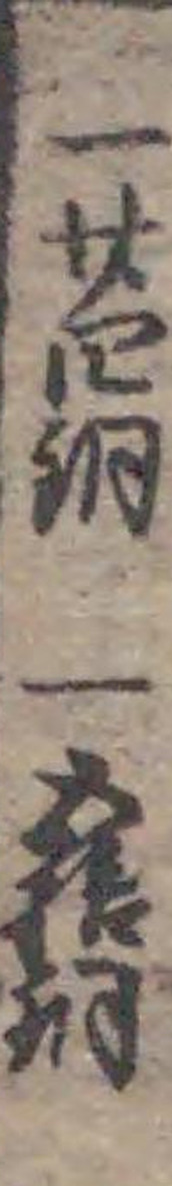一廿四銅一五拾銅
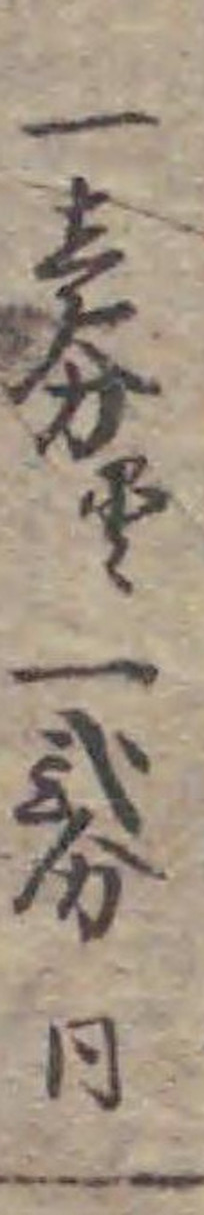一壱分品々一弐分同
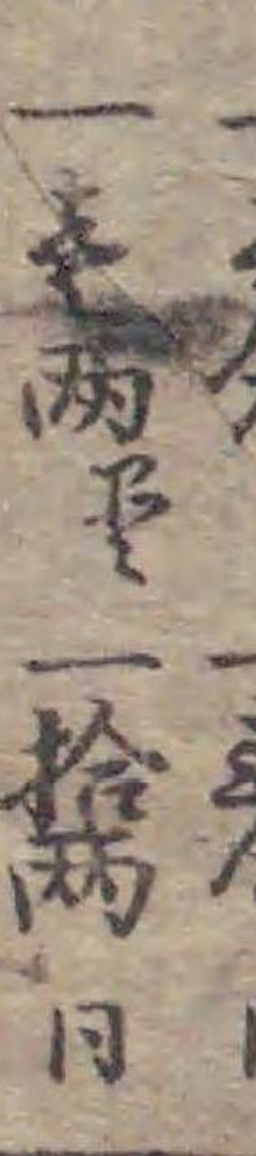一壱両品々一拾両同
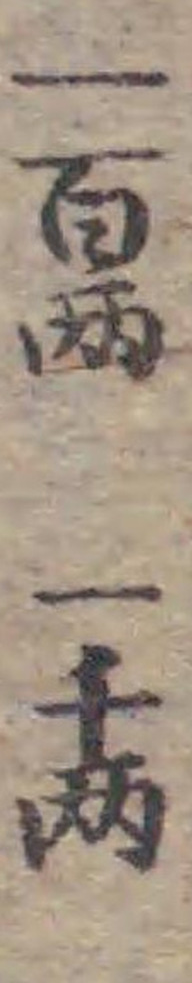一百両一千両
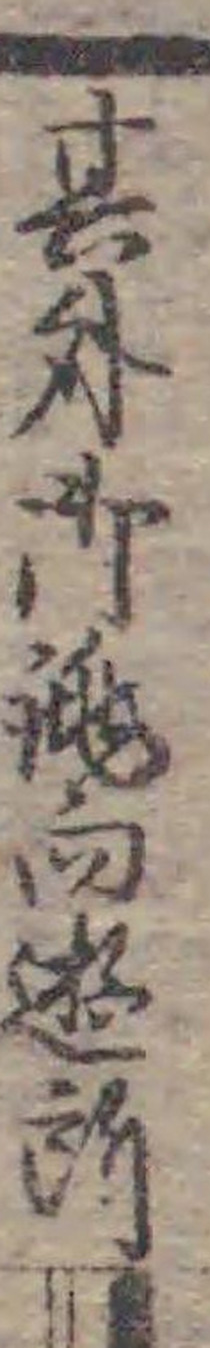其外御誂向遊所
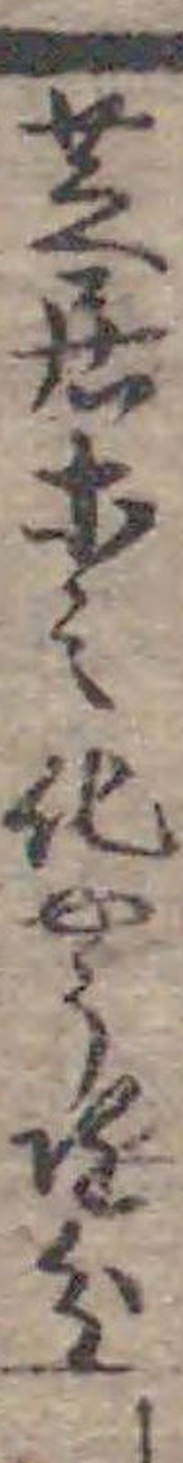芝居等之化やう随分
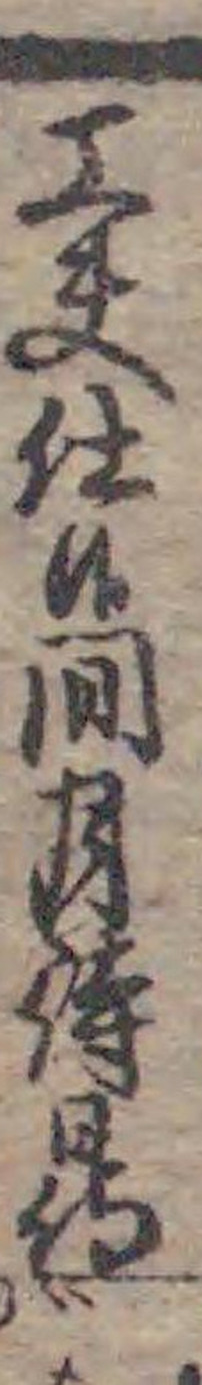工夫仕候間月待日待
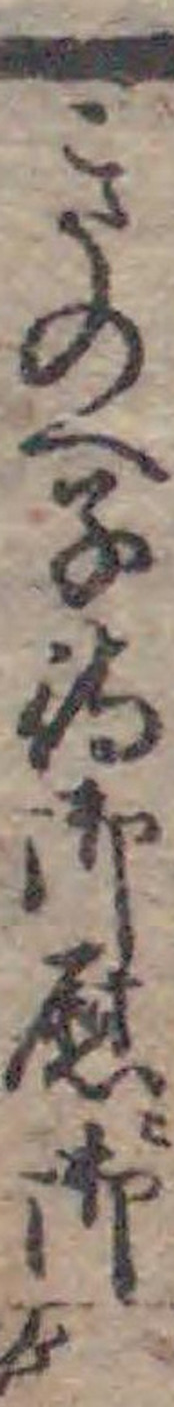きのへ子待御慰御
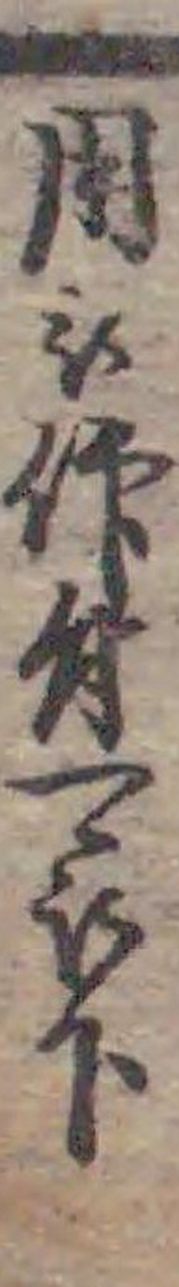用被仰付可被下

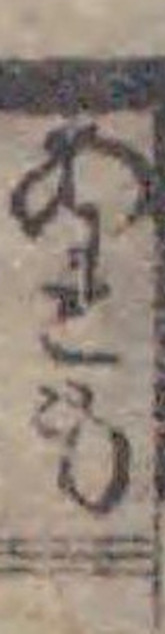あれも
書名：紺屋百物語 : 3巻
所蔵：国立国会図書館 National Diet Library, JAPAN
